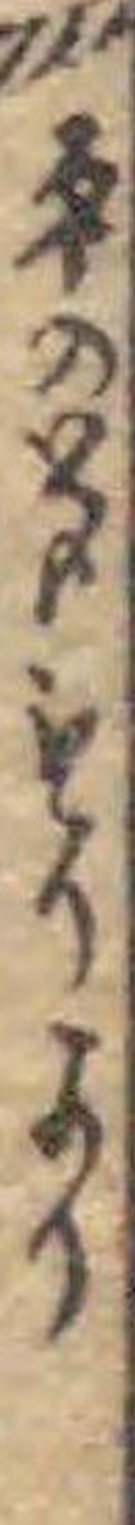平のとももりより
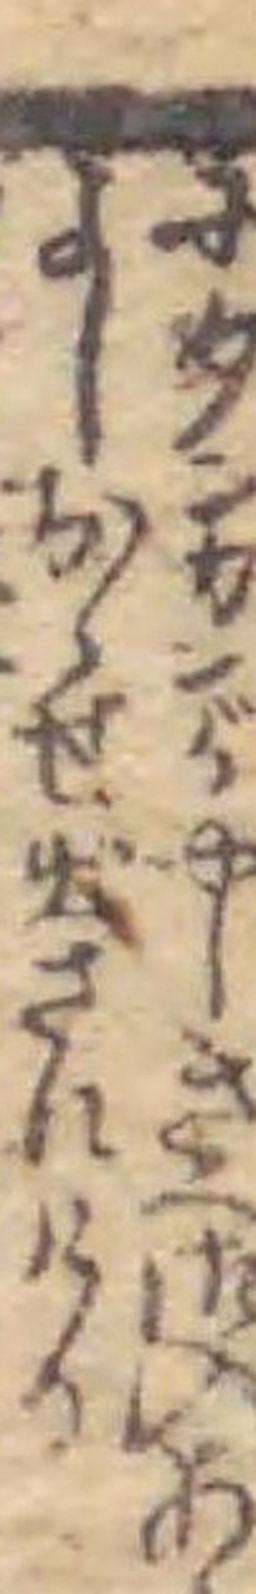よしおゝせ出されける
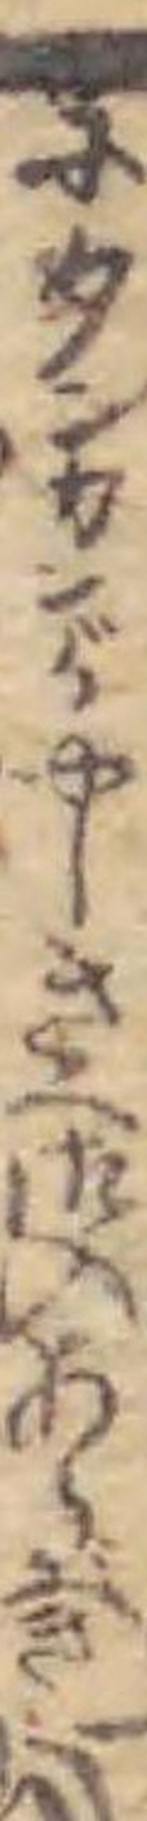にタンカンがやしきへ御入あるべき
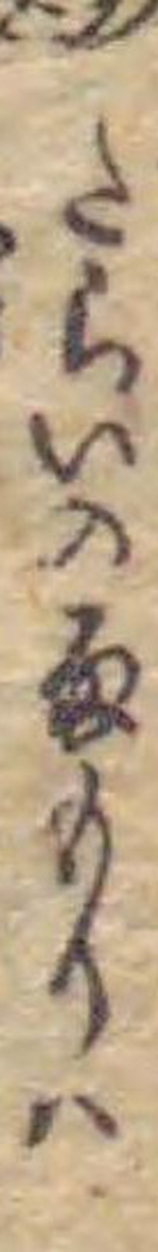たらいのまもりは
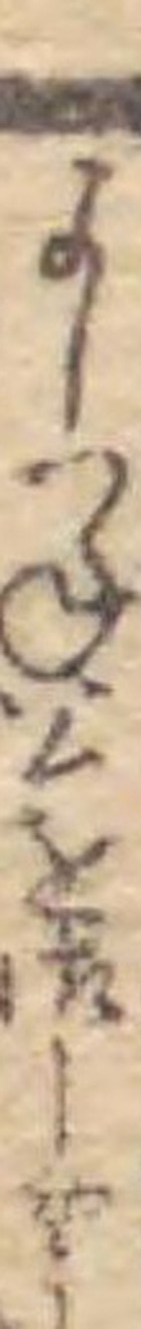よしつね公を御しやう
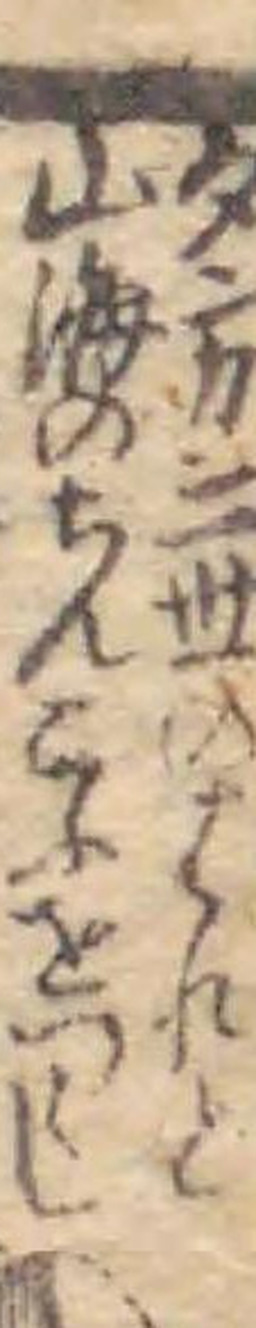山海のちんこふをつくし
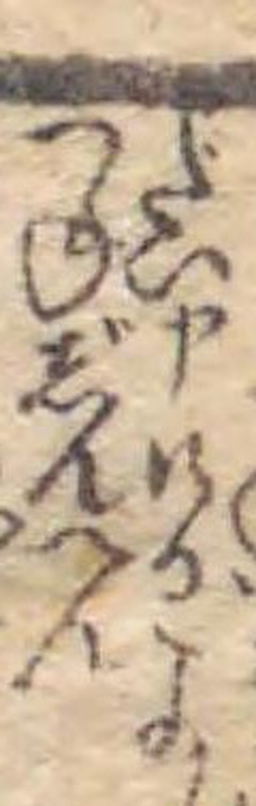つねじんへん
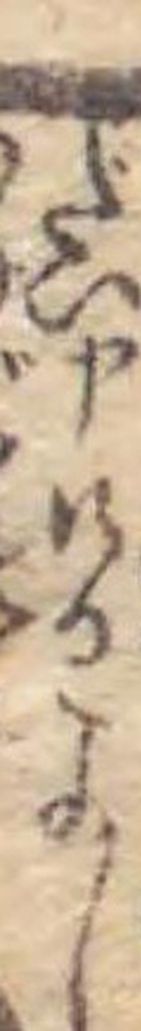たい申けるよし
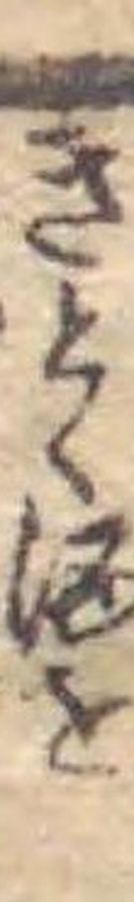きとく酒を
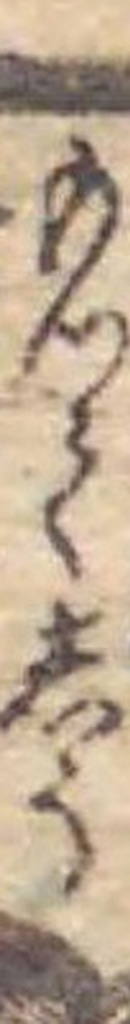もつてしう
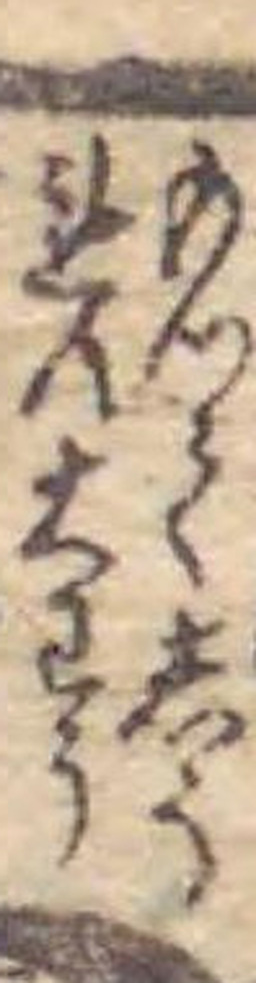れん大わう
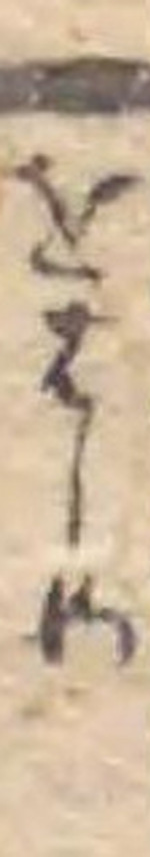をはしめ
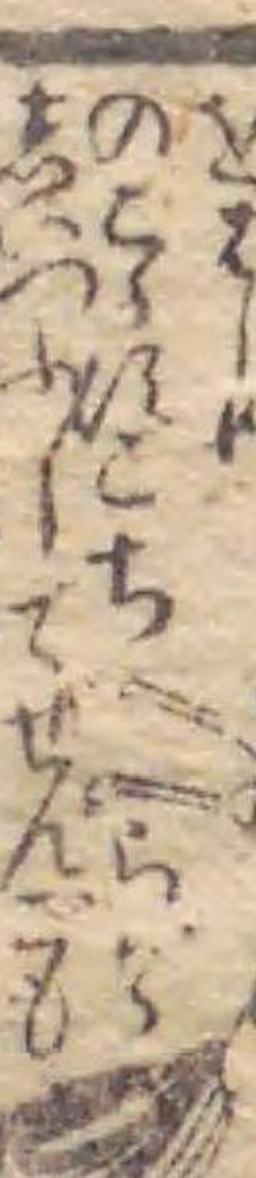しいつふしてぜんごも
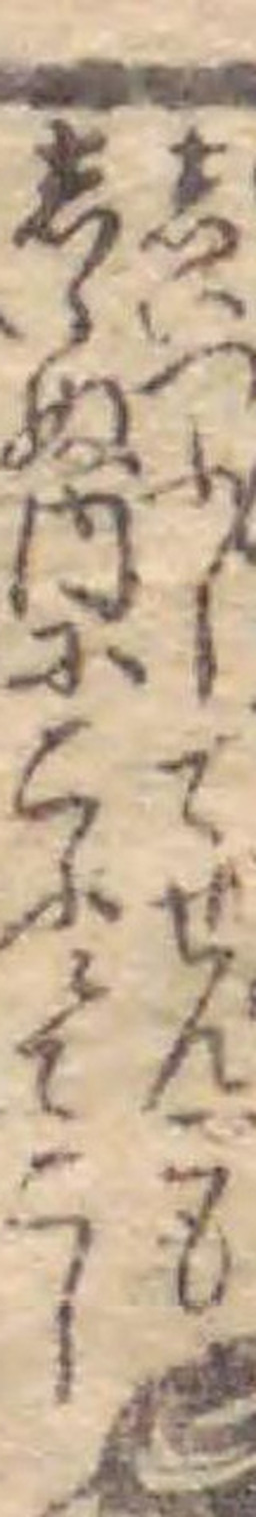しらぬ内にこふにてこし
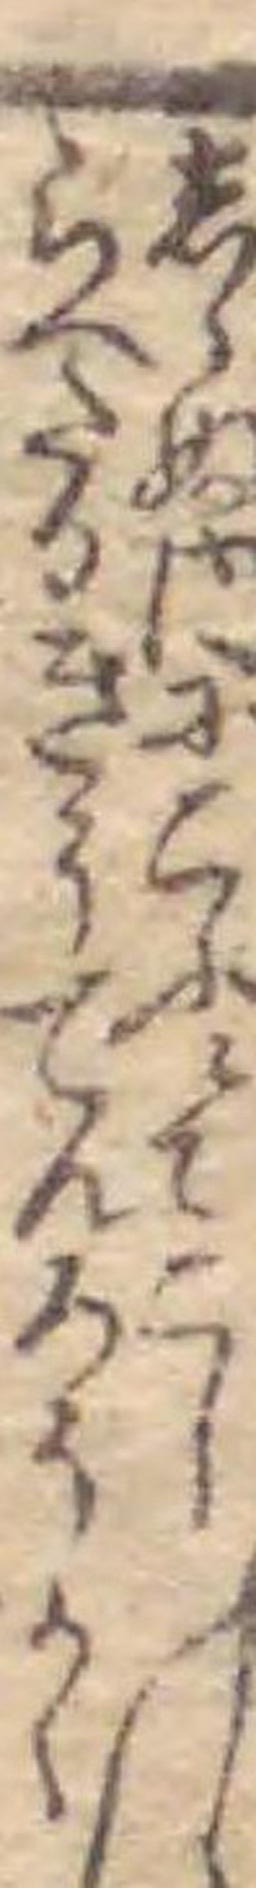らへたるきうてんろうかく
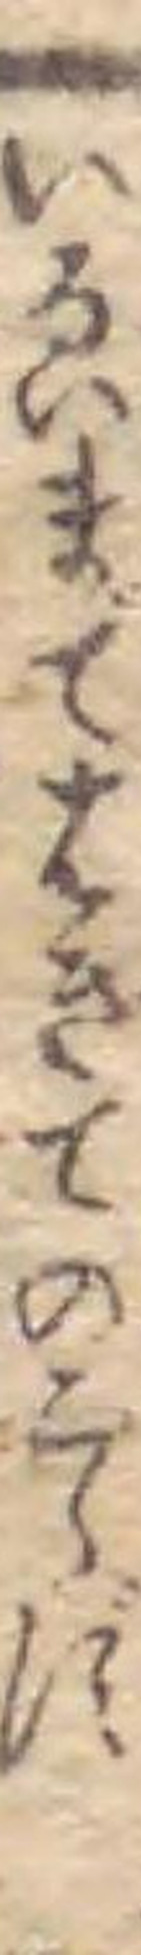いるいまではきてのこらず
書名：悦贔負蝦夷押領 : 3巻
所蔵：国立国会図書館 National Diet Library, JAPAN
